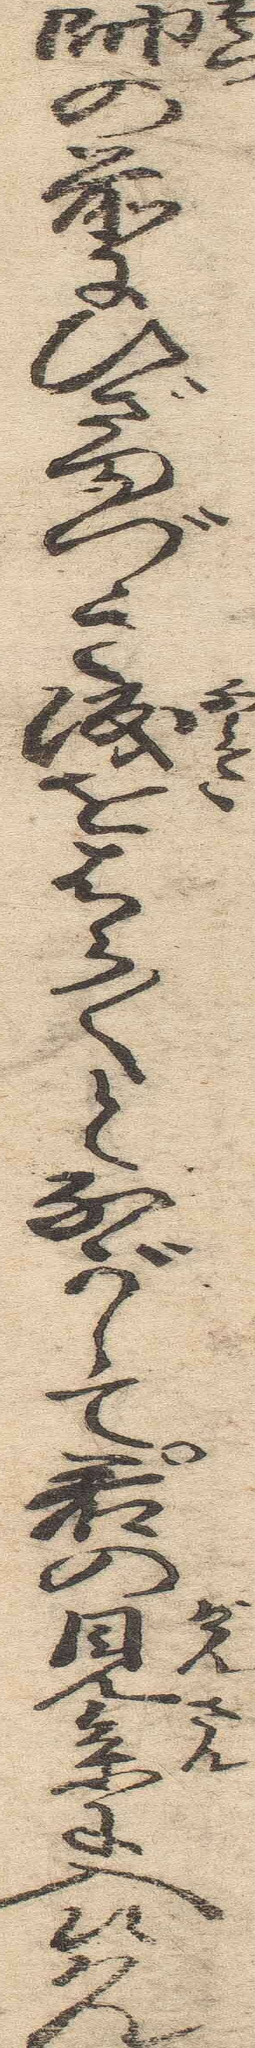師の前にひさまづき涙をはら〳〵とながして。君の見参に入候はん
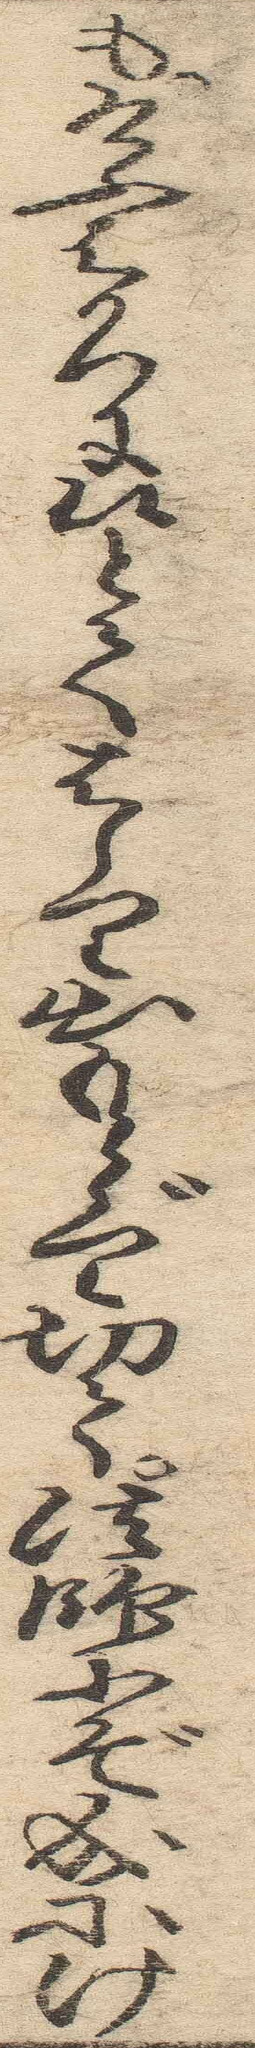もけふはかりに候とてはしり出もとゞり切て。法師にぞ成にけ
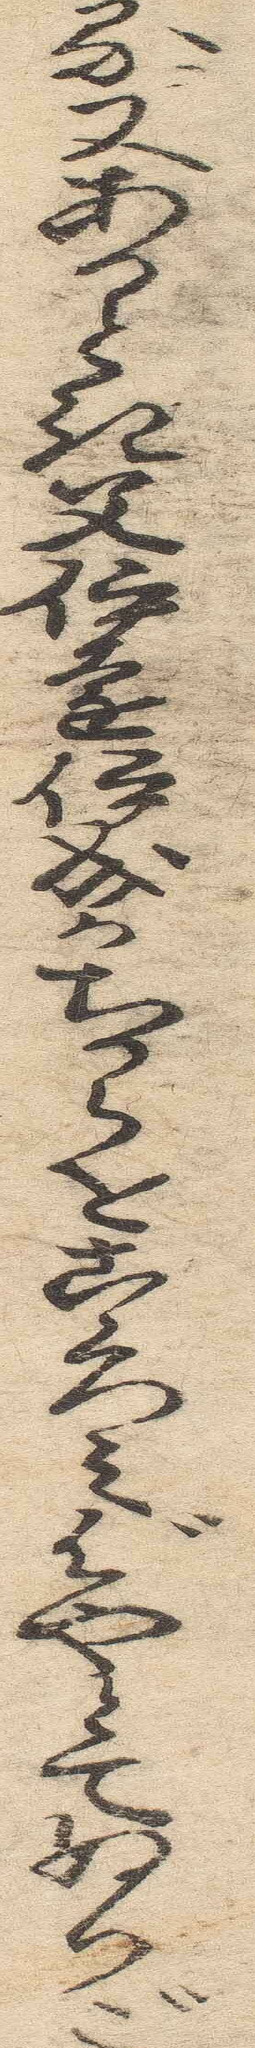る。又あるとき父伊遠伊成かちからをこゝろみばやとてぬりご
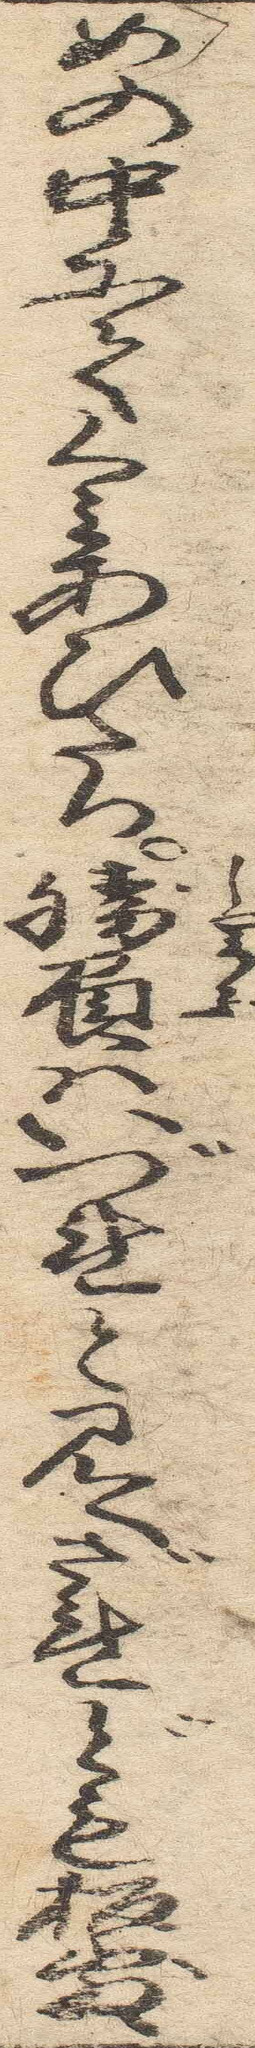めの中にてくみあひたり。勝負はいづれと見へざれども板敷
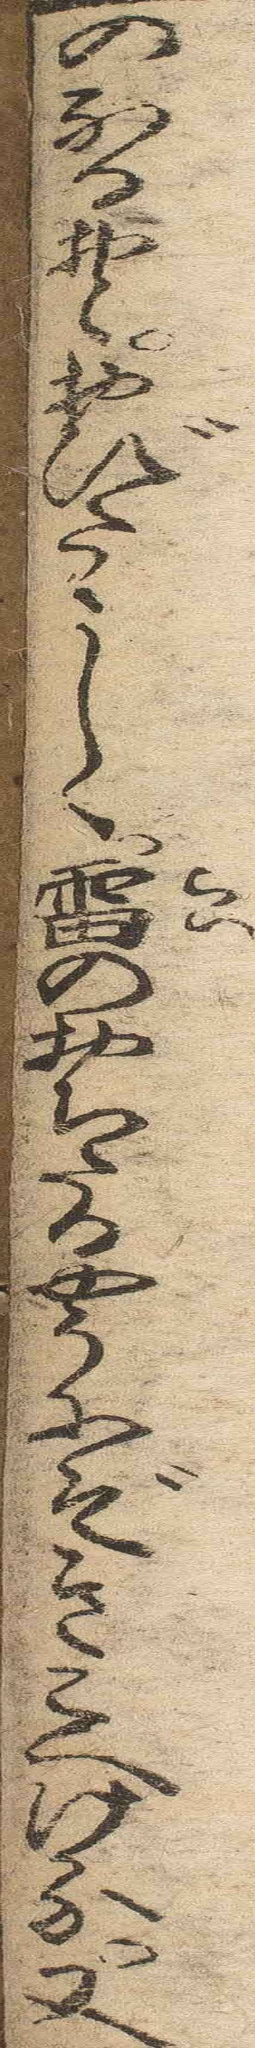のなるおと。おびたゞしく。雷のおちたるやうにぞきこへける。又
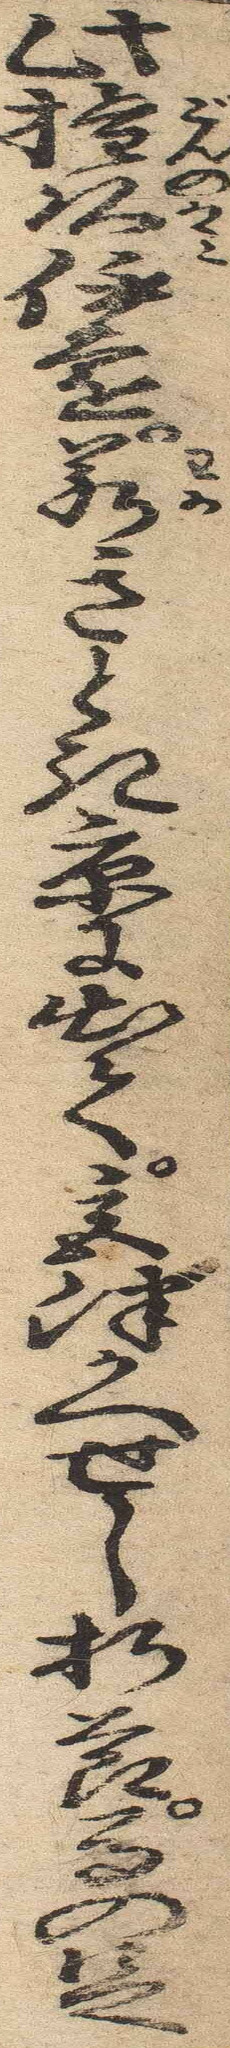此権頭伊遠。若きとき京に出て。宮つかへせし折節。馬の足
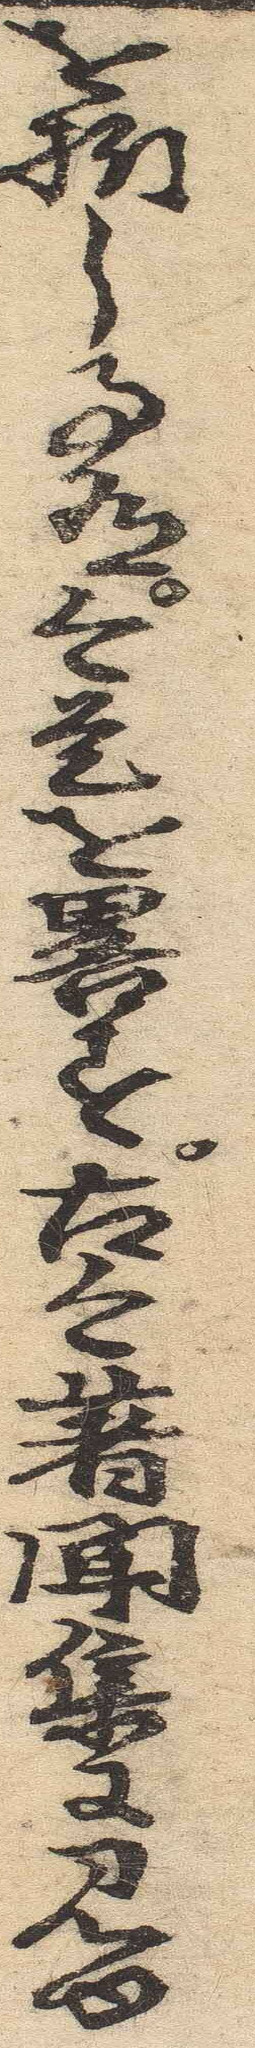を折し事有。今是を畧す。古今著聞集に見ゆ
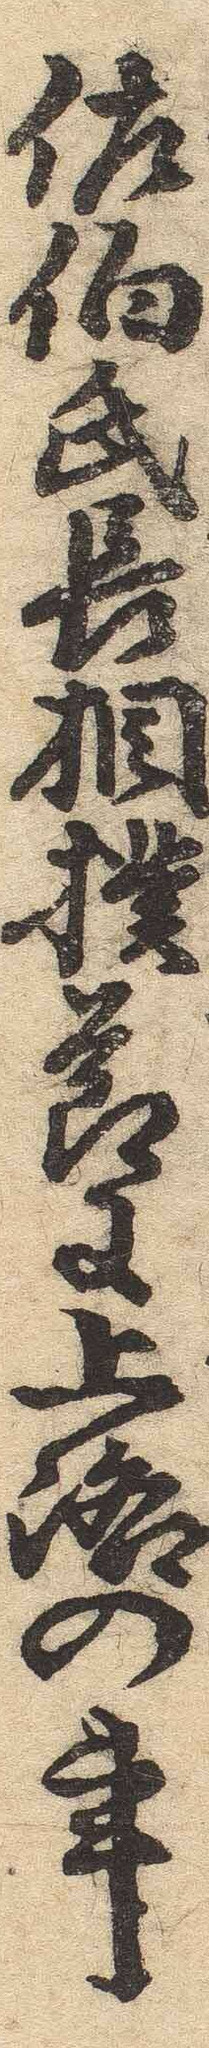佐伯氏長相撲節に上洛の事
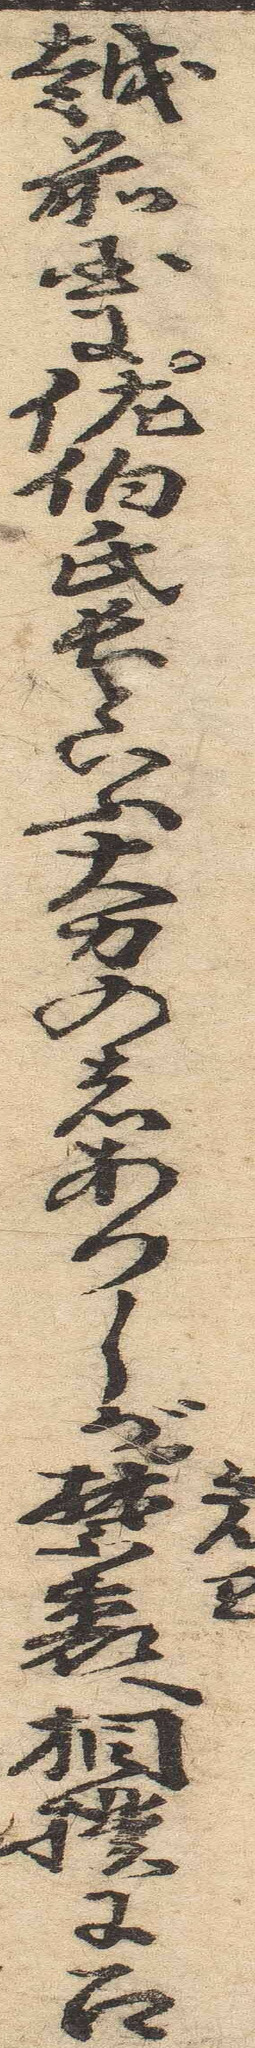越前国に。佐伯氏長といふ大力の者ありしが。禁裏へ相撲に召
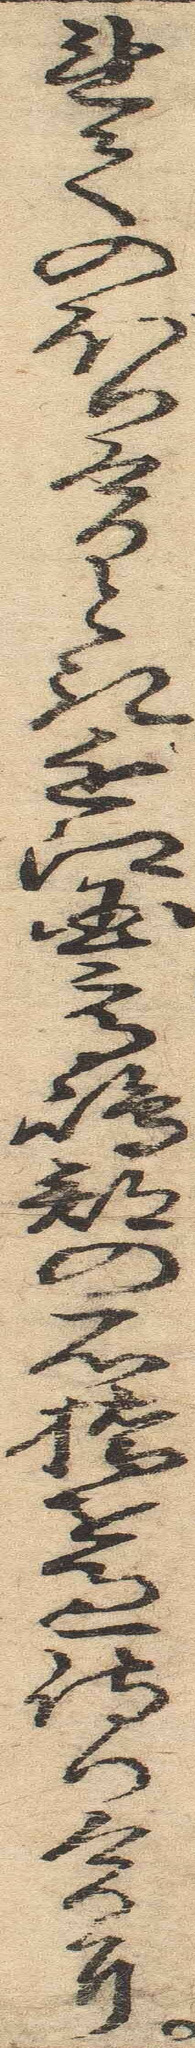れてのぼりけるとき近江国高嶋郡の石橋を過侍りけるに。
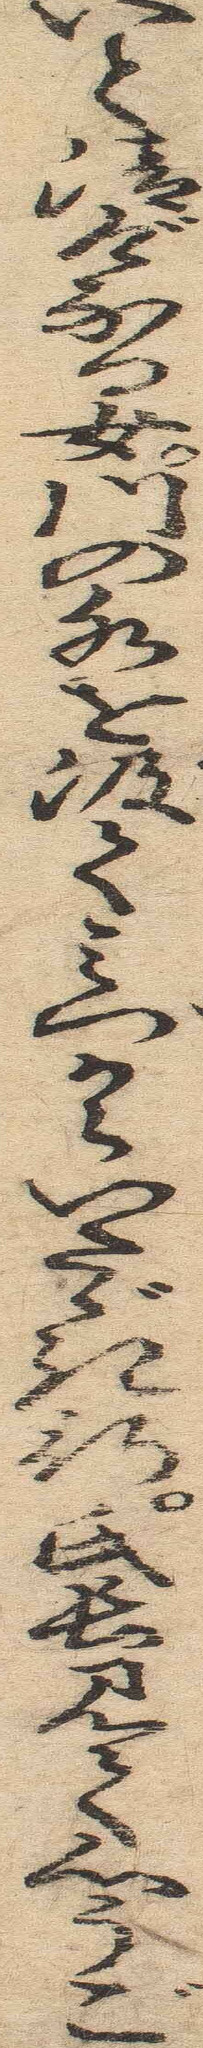いと清げなる女。川の水を汲てみづからいたゞき行。氏長見て心うご
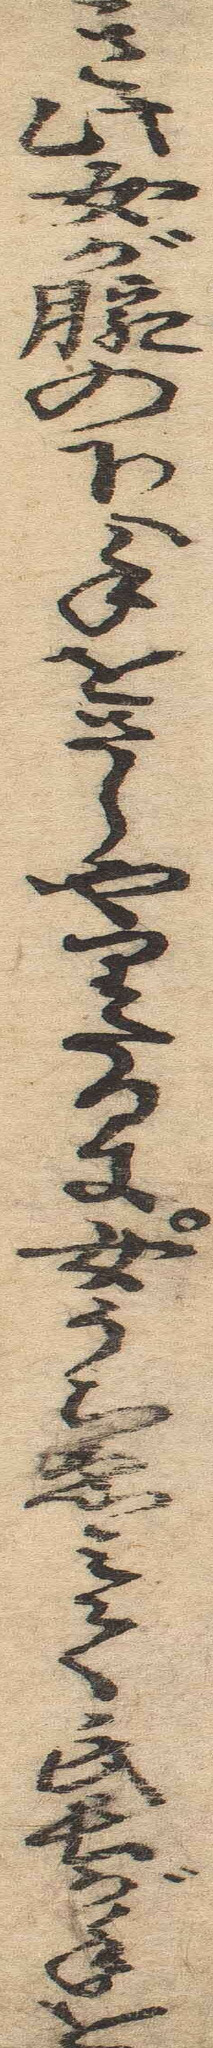き此女が腕の下へ手をさしやりたるに。女うちえみて氏長が手を
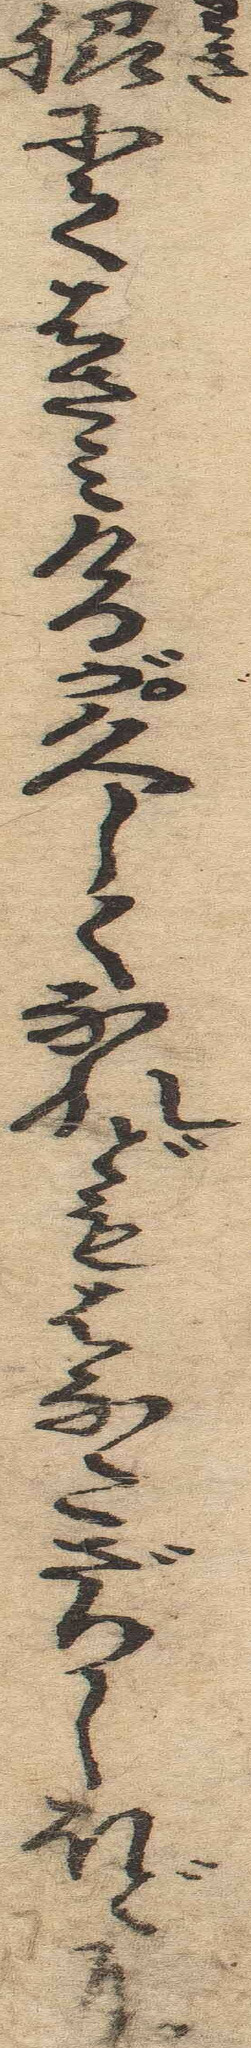脇にてはさみけるが久しくなれどもはなたざりしほどに
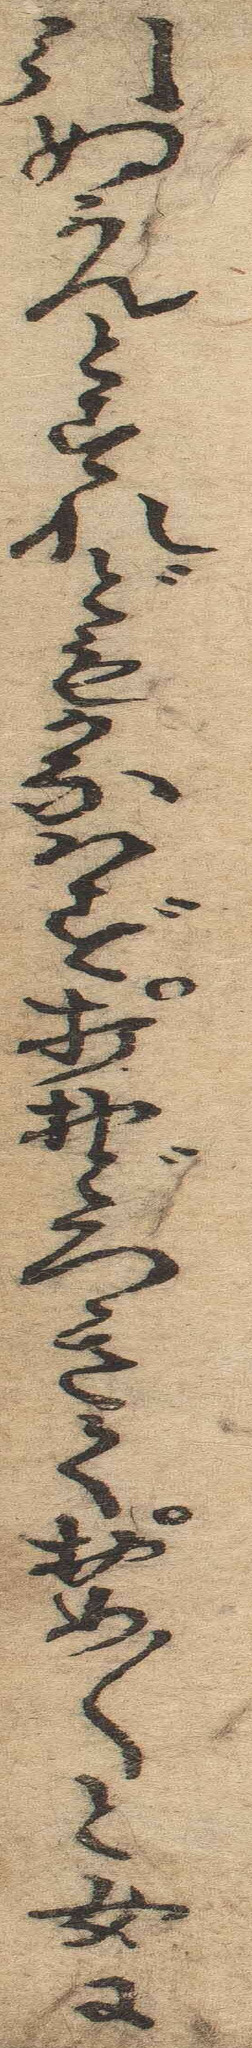引ぬかんとすれどもかなはず。打おどろきておめ〳〵と女に

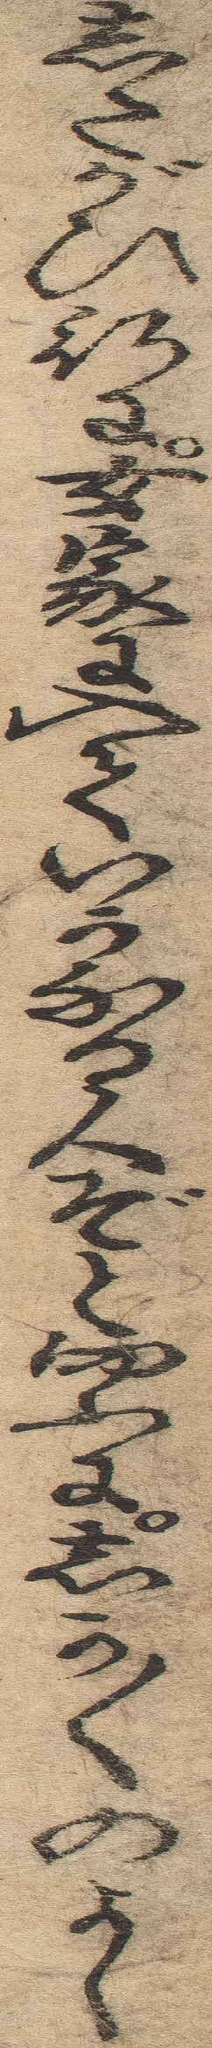したがひ行に。女家に入ていかなる人ぞと問ふに。しか〳〵のよし
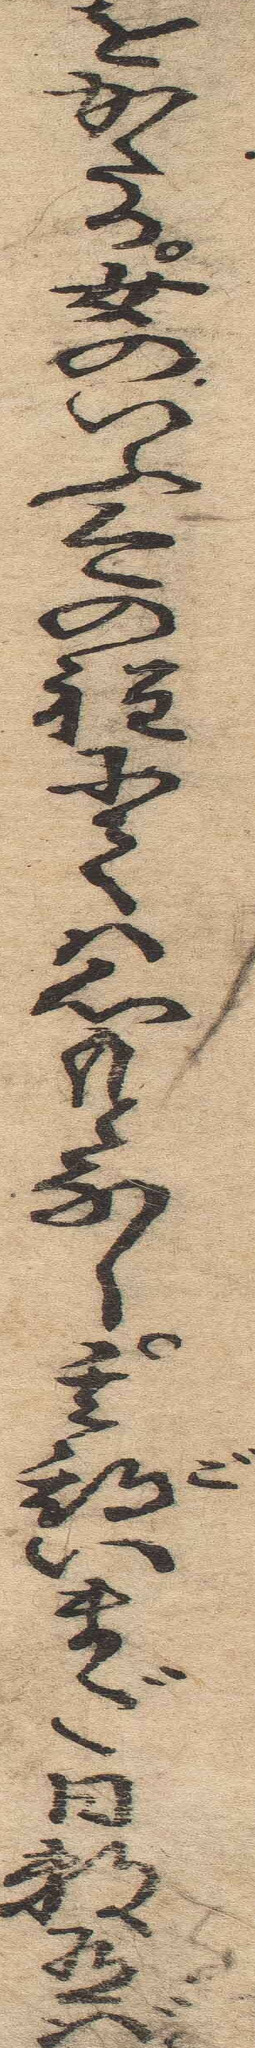をかたる。女のいふ、今の程にては心もとなし。其期いまだ日数有ば
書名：古今相撲大全
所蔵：東京学芸大学附属図書館 国文学研究資料館
